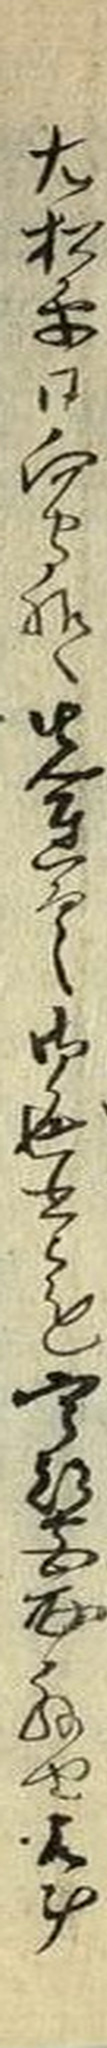右松平日向守様へ先達而之御返書被遊宇都宮勘解由取計
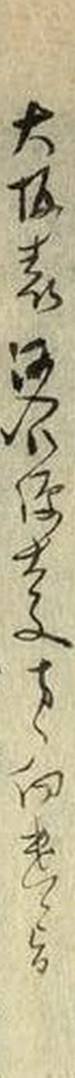大坂表河合源太夫方へ向遣候旨
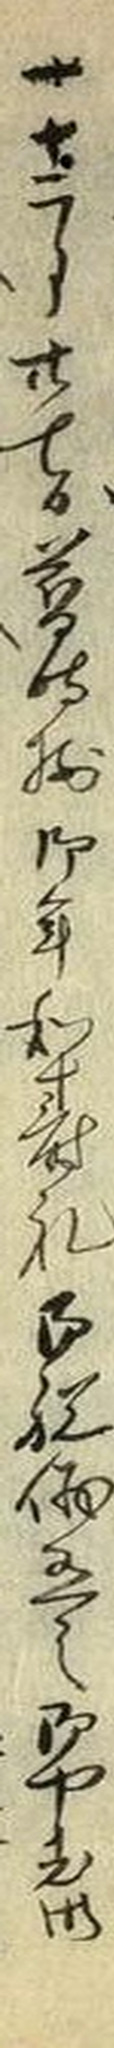一十二月廿七日暮時揃御年和寿礼御祝儀有之御中老御
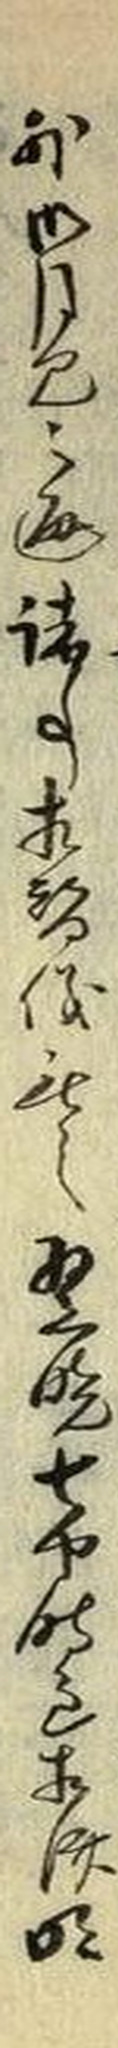外御月見之通諸事相替儀無之翌暁七半時過相済明
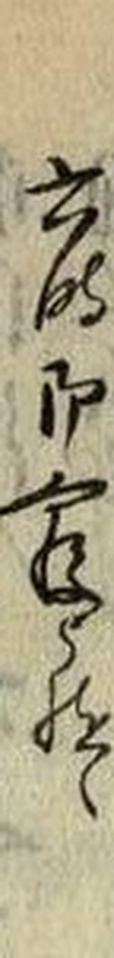六時御寝被遊候
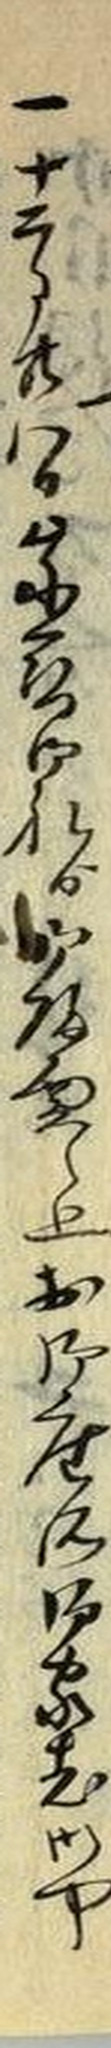一十二月廿八日歳暮御礼ゟ御帰殿之上於御座所御家老御中
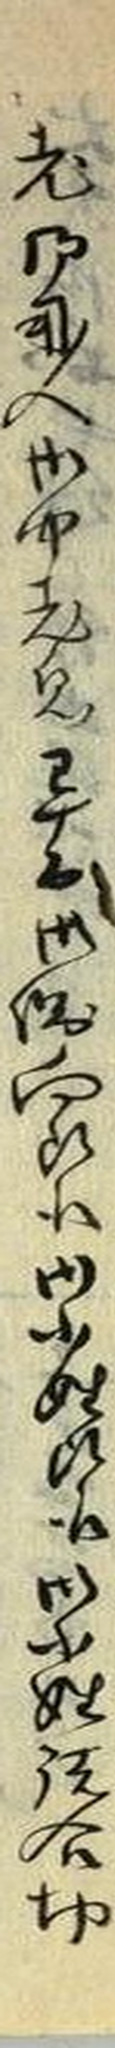老御用人御中老息畢而御側向頭取御小姓頭取御小姓詰合切
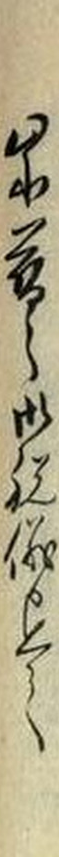歳暮之御祝儀申上之
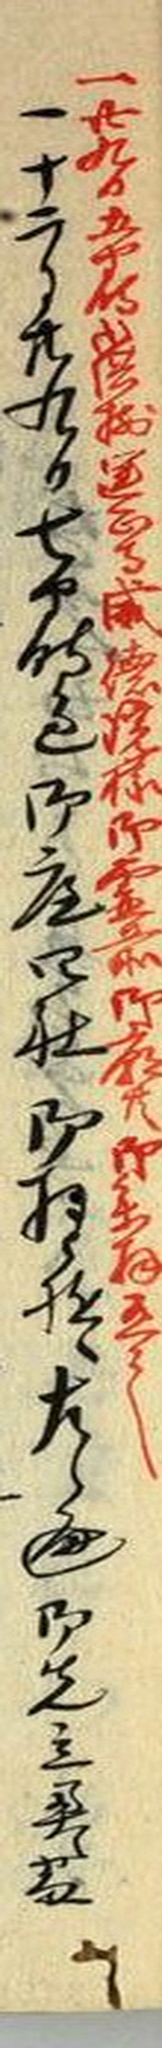一十二月廿九日七半時過御庭四社御拝被遊候左之通御先立奥之番
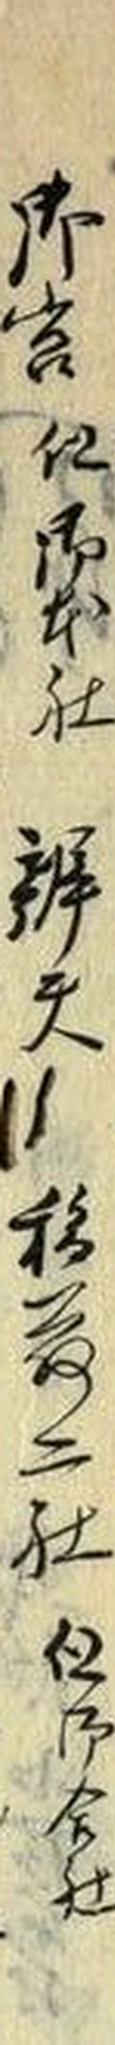御宮但御本社弁天稲荷二社但御合社
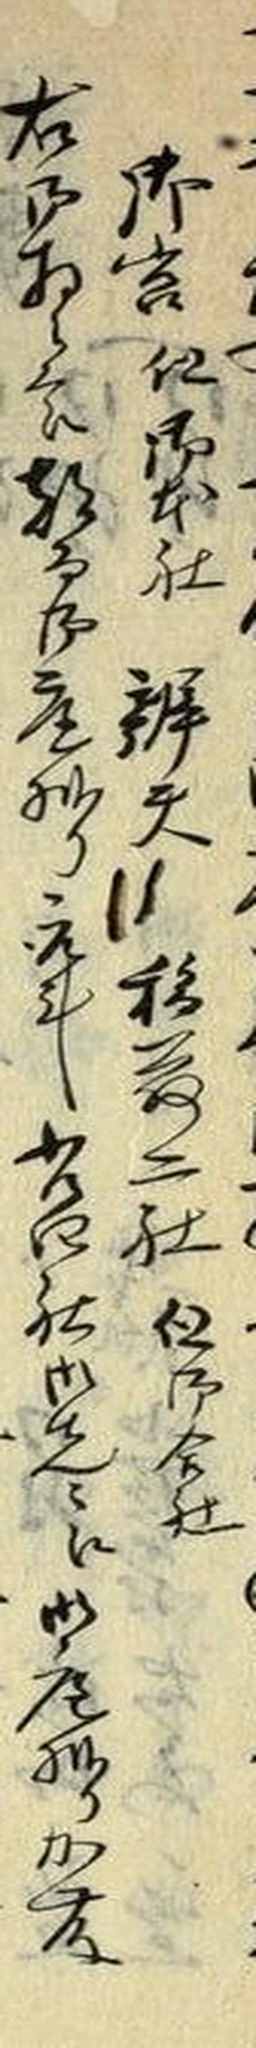右御拝之節都而御庭掛り取計右四社御先々江御庭掛り加藤
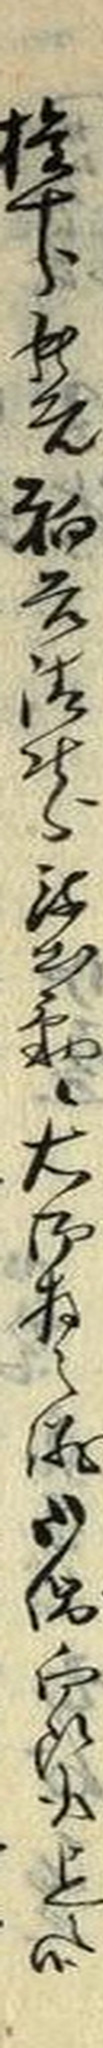権十郎罷出ル粕谷清次郎致出勤候右御拝之儀御側向頭取申上之候
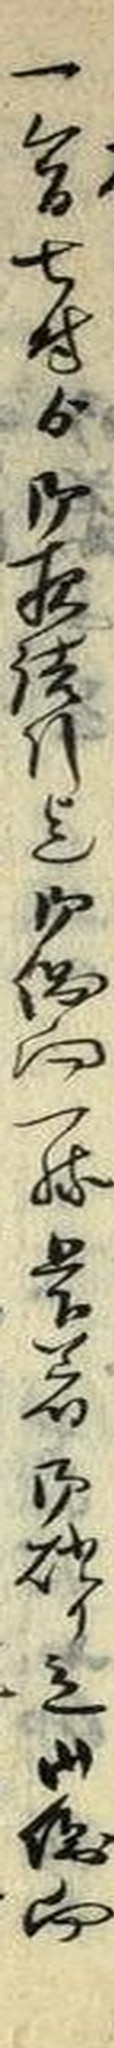一今日七時ゟ御夜詰引迄御側向一統上下着御燈り立御側向
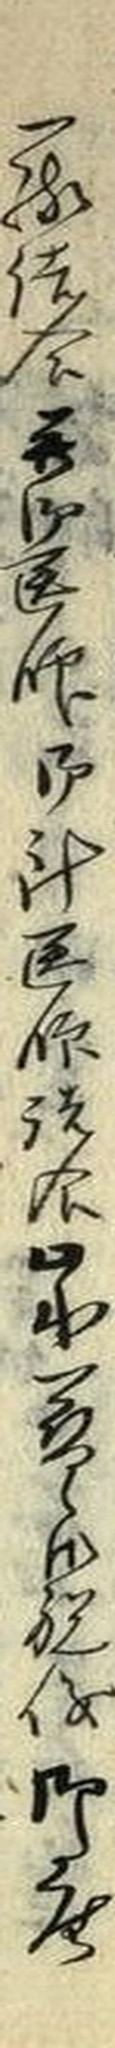一統詰合幷御医師御針医師詰合歳暮之御祝儀御座
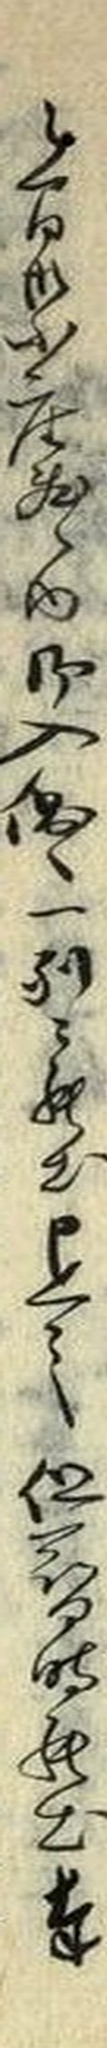之間御小座敷之内御入側へ一列ニ罷出申上之但暮時罷出奉
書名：少傅日録抄（斉承付側向頭取日記、在国）
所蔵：福井県文書館 Fukui Prefectural Archives
